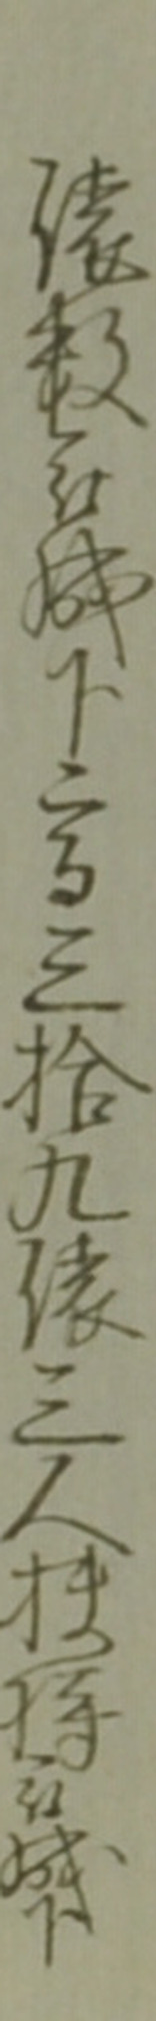俵数被成下高三拾九俵三人扶持被成下
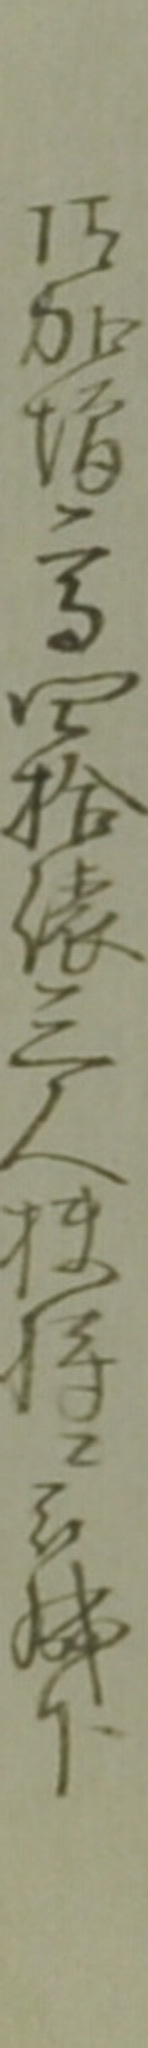御加増高四拾俵三人扶持ニ被成下
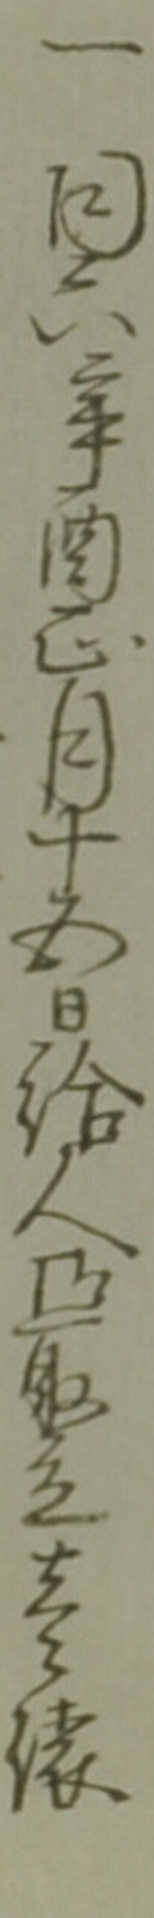一同六辛酉正月十五日給人御取立一俵
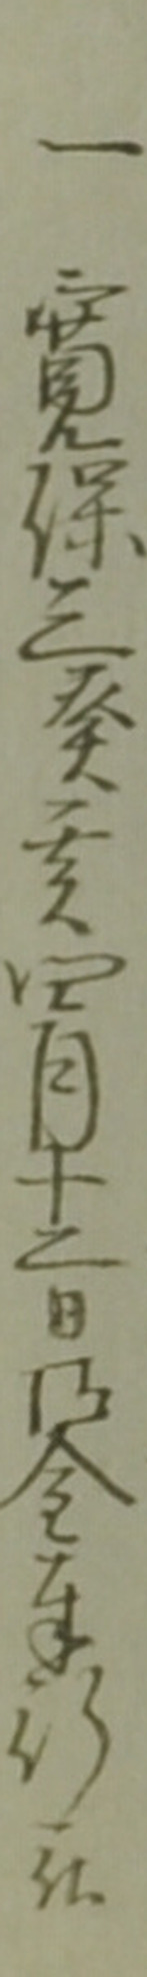一寛保三癸亥四月十二日御金奉行被
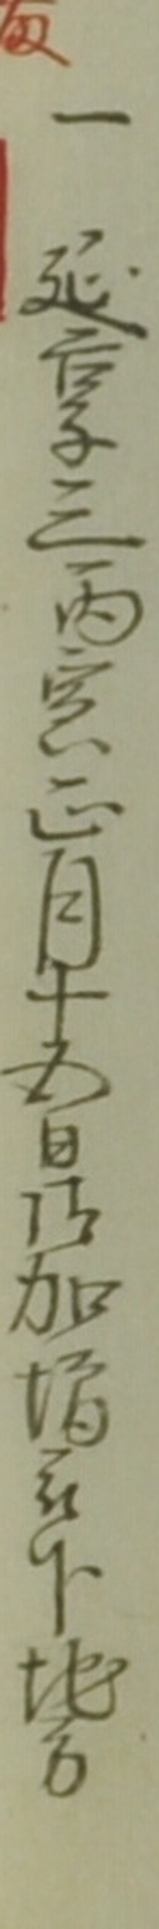一延享三丙寅正月十五日御加増被下地方

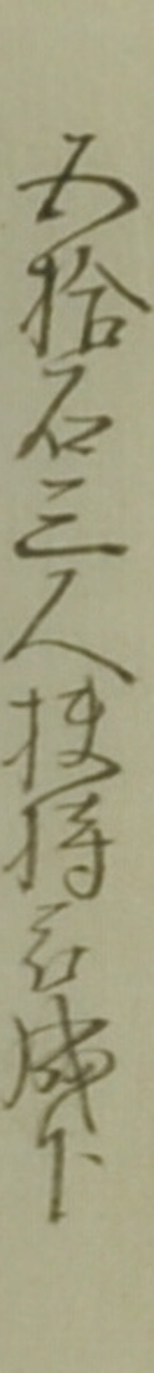五拾石三人扶持被成下
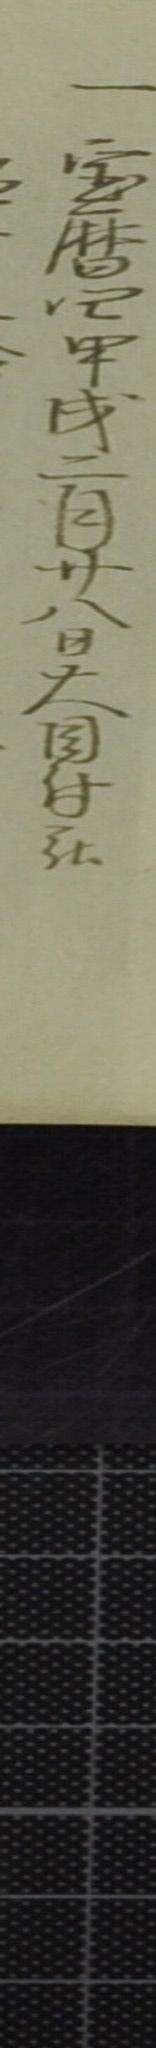一宝暦四甲戌二月廿八日大目付被
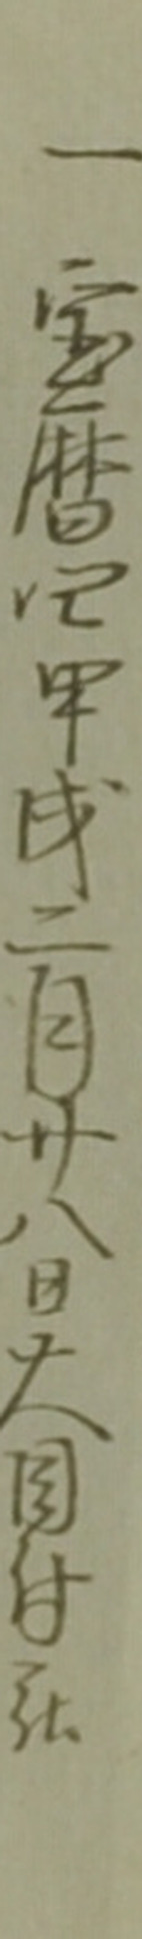一宝暦四甲戌二月廿八日大目付被
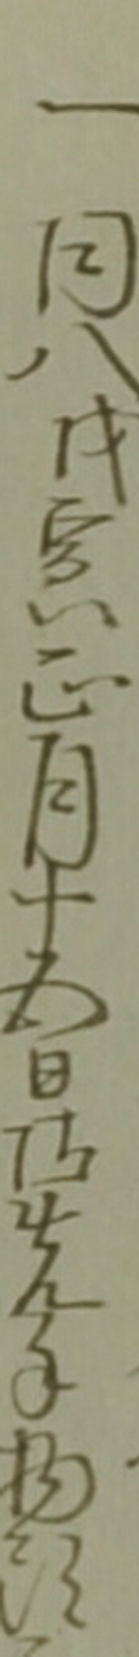一同八戊寅正月十五日御先手物頭被
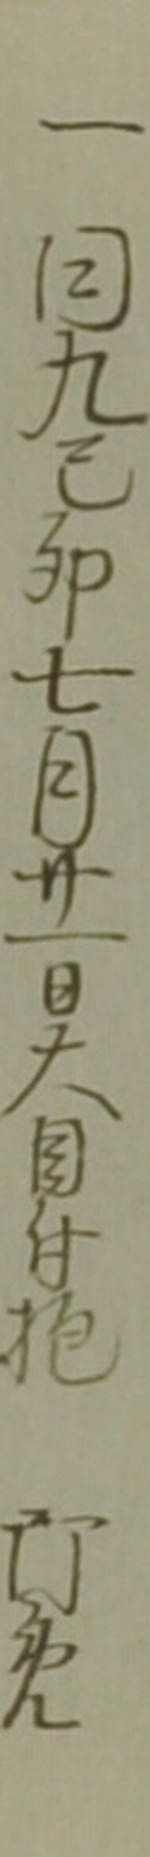一同九己卯七月廿一日大目付抱御免
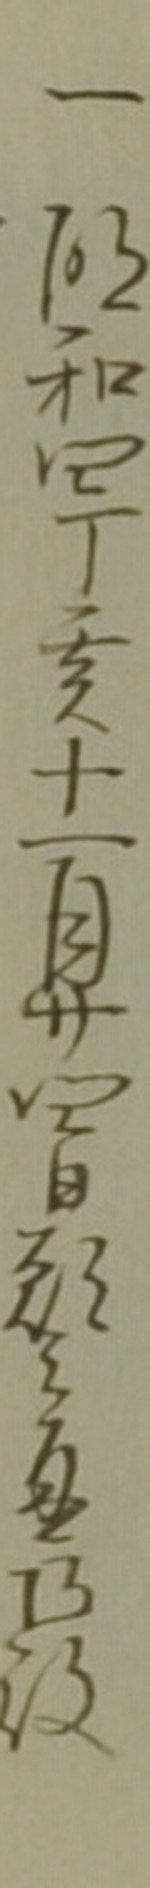一明和四丁亥十一月廿四日願之通御役
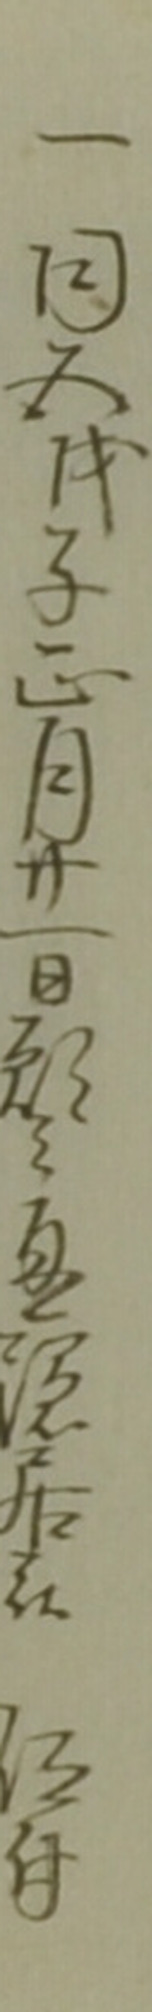一同五戊子正月廿一日願之通隠居被仰付
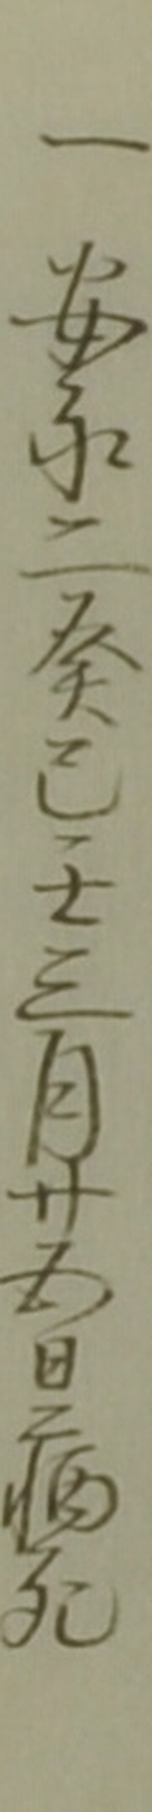一安永二癸巳閏三月廿五日病死
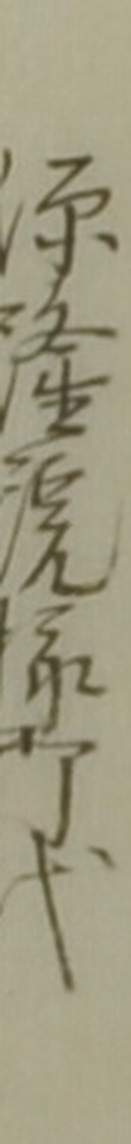源隆院様御代
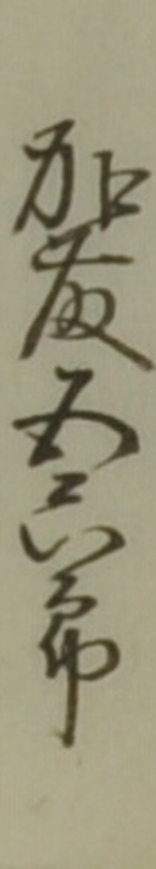加藤五六郎
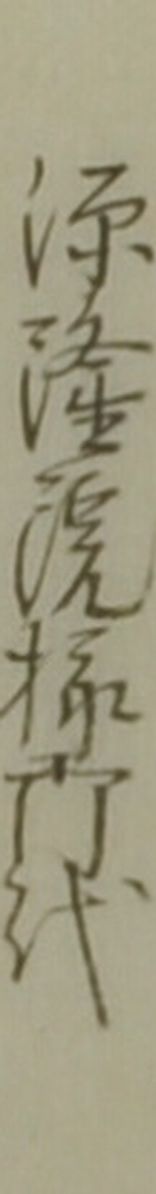源隆院様御代
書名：給人諸士勤仕録（三）
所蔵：伊那市立高遠町図書館・合同会社AMANE
